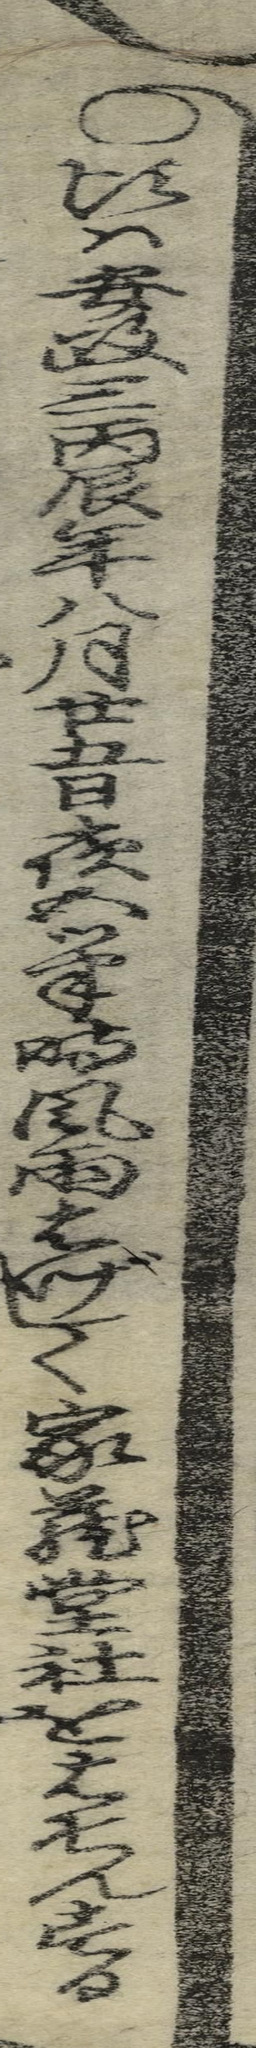◯頃は安政三丙辰年八月廿五日夜五ッ半時風雨はげしく家蔵堂社をはそんする
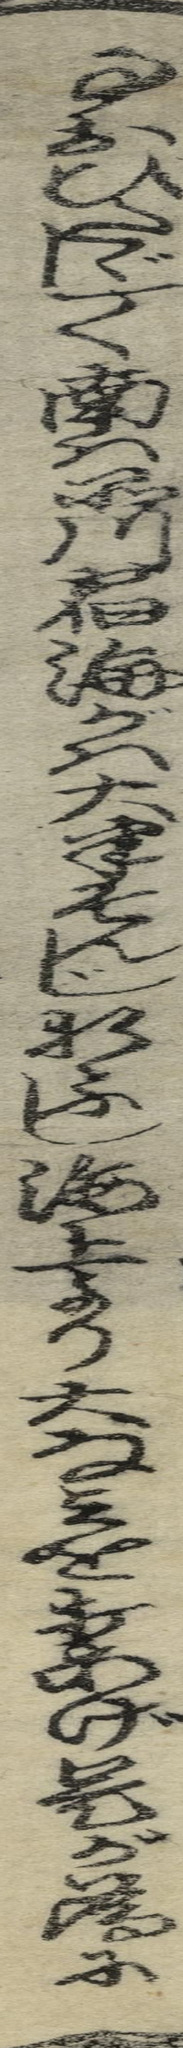事おひたゞしく南は品川宿海かは大半そんじ折ふし海上より大なみを打あげ是が為に
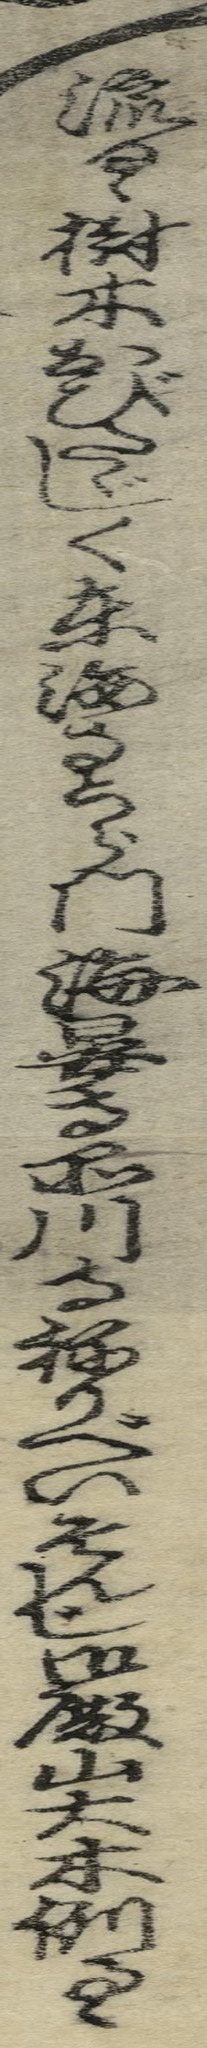流るゝ樹木おびたゞしく東海寺とら門海晏寺品川寺ねりべいそんじ御殿山大木倒るゝ
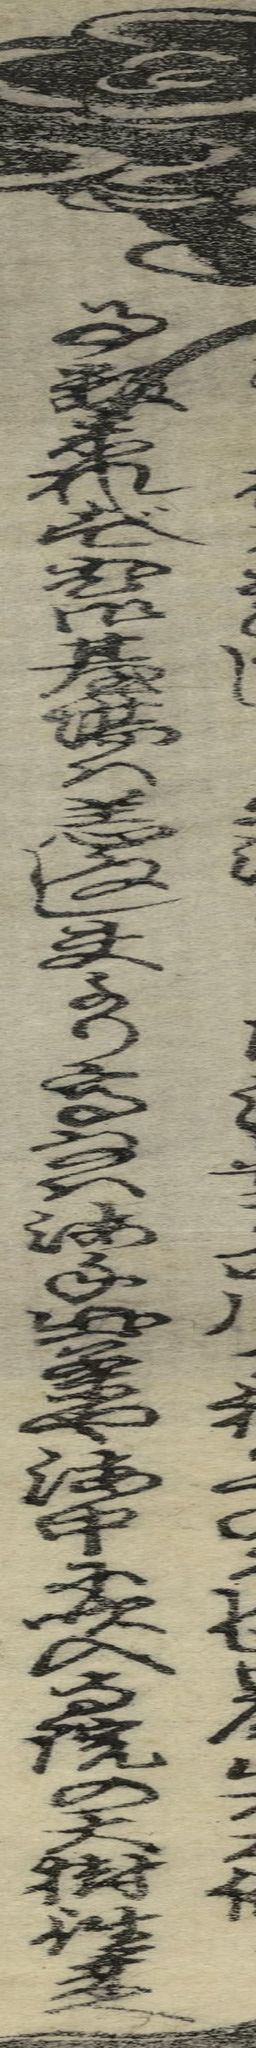事數しれず尤御台場は恙なし夫より高なは海手出茶や海中に吹入る院の大樹往来へ
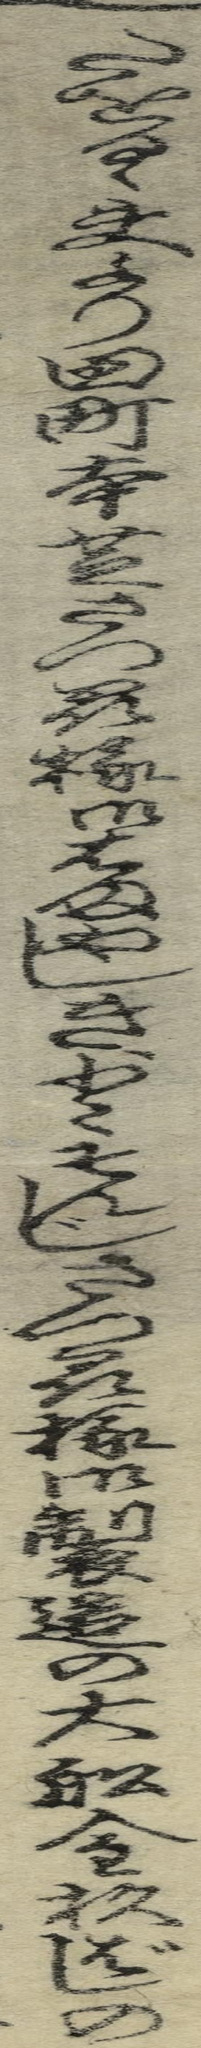たをるゝ夫より田町本芝さつ州様御はまやしき少々そんじさつ州様御製造の大船金杉ばしの
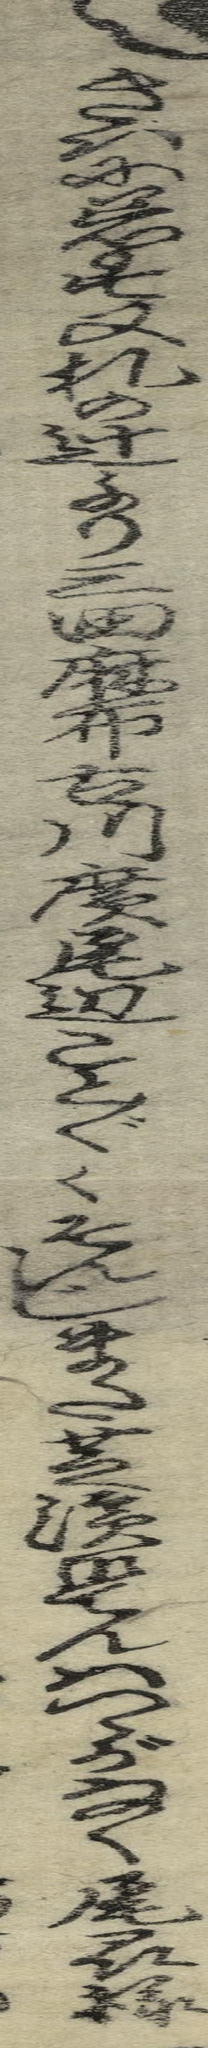きはに着す又札の辻より三田麻布古川広尾こと〴〵くそんじまた芝浜御てんはつゝがなく尾州様
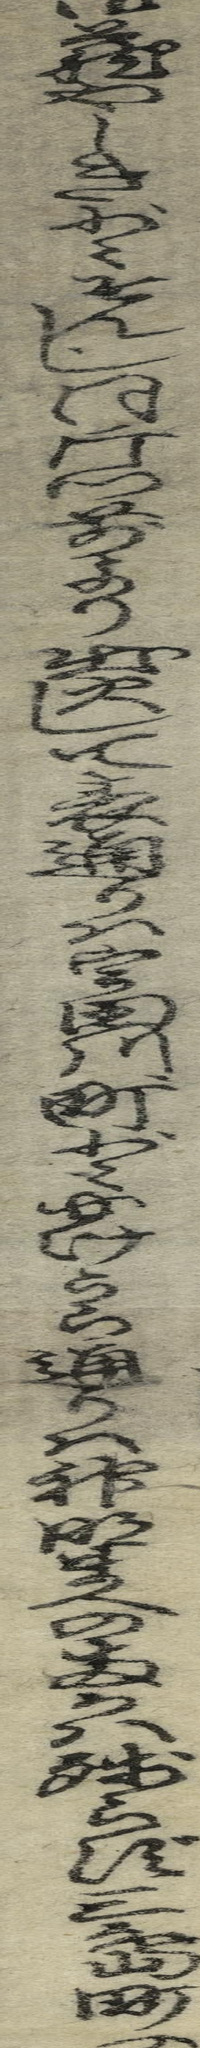御蔵やしき少々そんじ同所門前より出火して表通りは宇田川町少々やけうら通りは神明まへの兩かは残らず三嶋町の
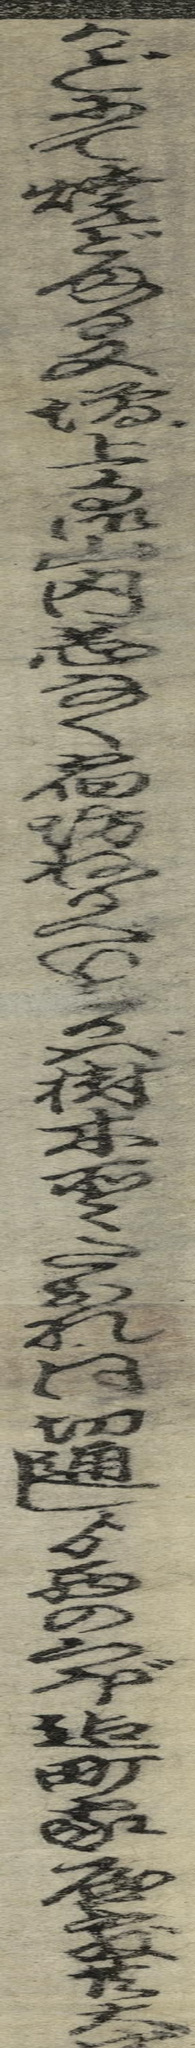かどにて焼どまる又増上寺御山内恙なく宿坊ねりへいは樹木所々たおれ同切通しゟ西のくぼ迄町家屋敷共大半
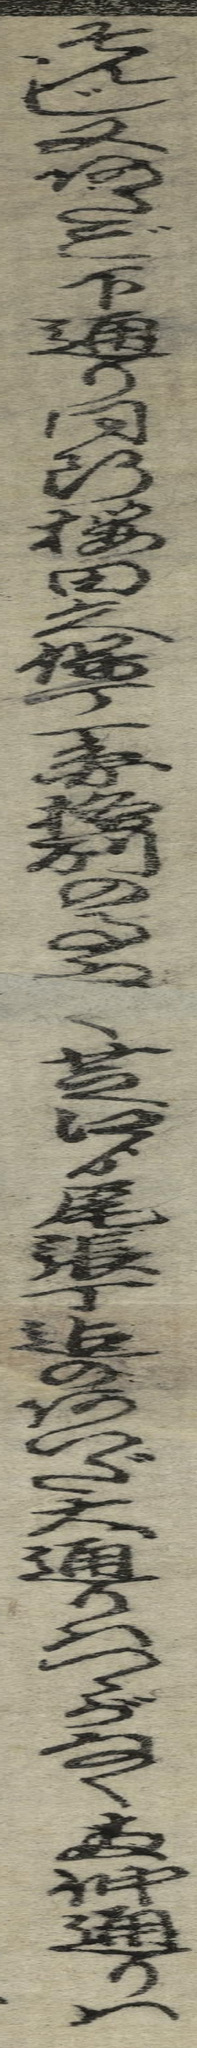そんじ又あたご下通り同断桜田久保丁一円格別の事なく芝口ゟ尾張丁迄のあいだ大通りはつゝがなく兩仲通りは
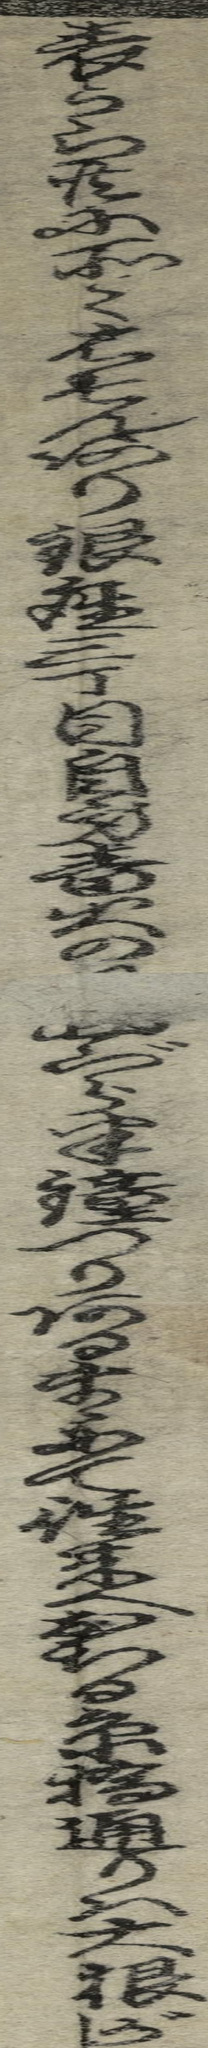表うら共に所々はそんあり銀座三丁目自身番火の見やぐら半鐘つりあるまゝにて往来へおちる京橋通りは大根がしへ
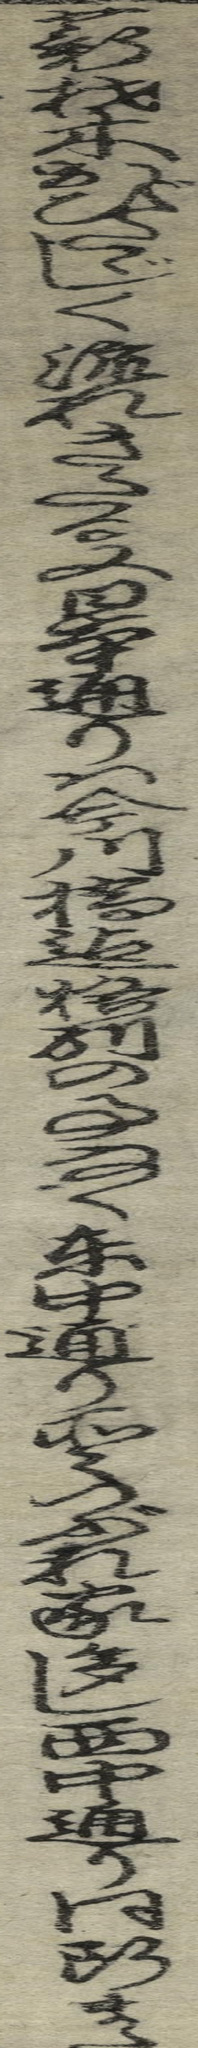薪材木おびたゝしく流れきたる又日本通りは今川橋迄格別の事なく東中通り所々つぶれ家多し西中通り同断また
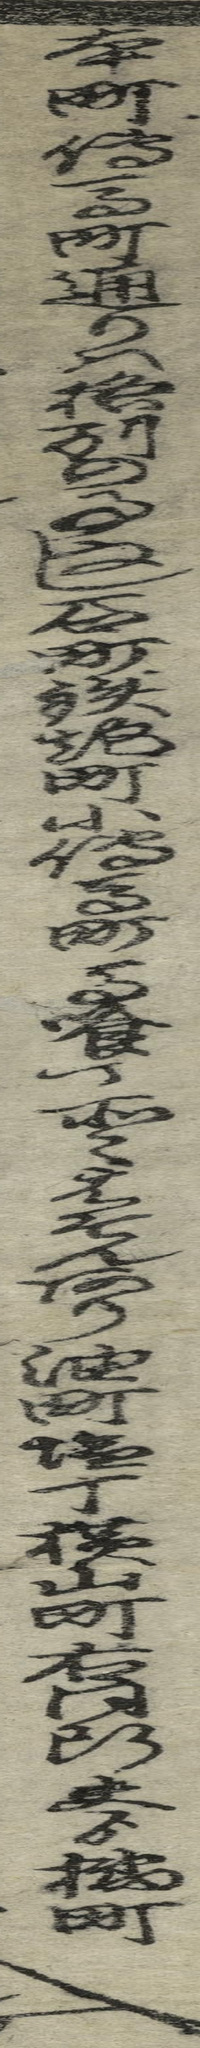本町伝馬町通りは各別の事なし原町鉄炮町小伝馬町馬喰丁所々はそんあり油丁横山町右同断夫ゟ橘町
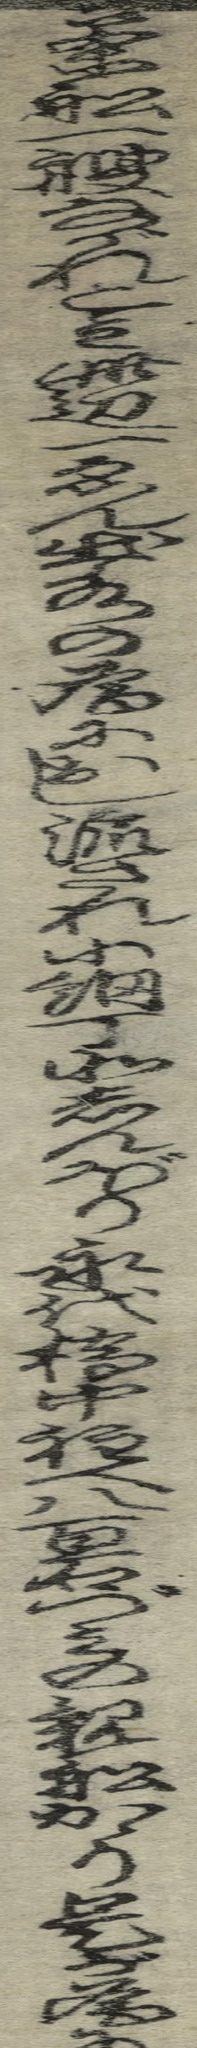茶船一艘ながれこみ此辺一ゑん出水の為にかし流され小網丁北しんぼり永代橋中程へは八百石づみの親船かゝり是が為に
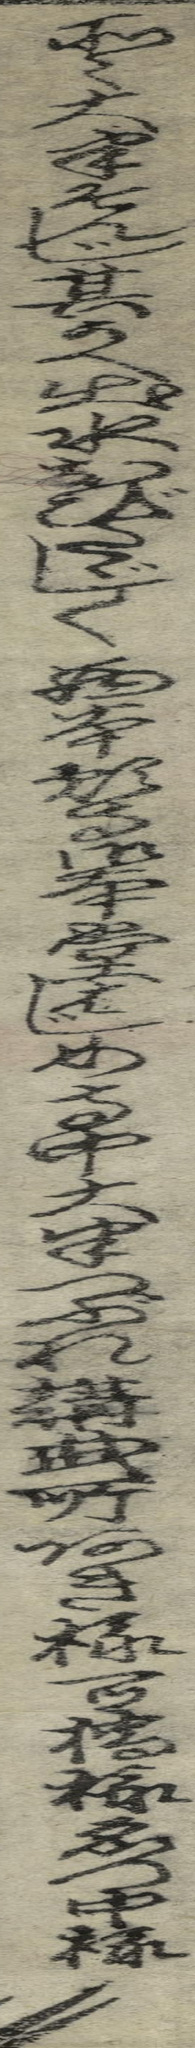所々大半そんじ其うへ出水おびたゞしく西本願寺本堂はじめ寺中大半つぶれ講典所あき様一ッ橋様ゑつ中様
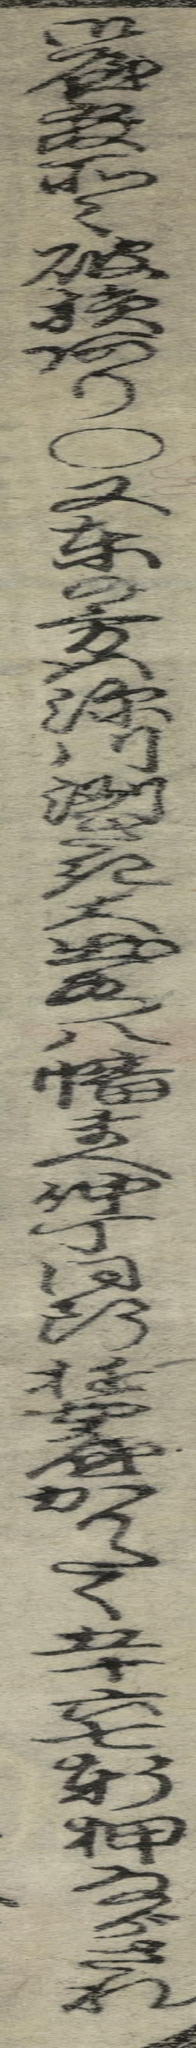御屋敷所々破損あり◯又東の方は深川洲さき大出水八幡まへ仲丁同断遊女屋かりたく五十六七軒押ながされ
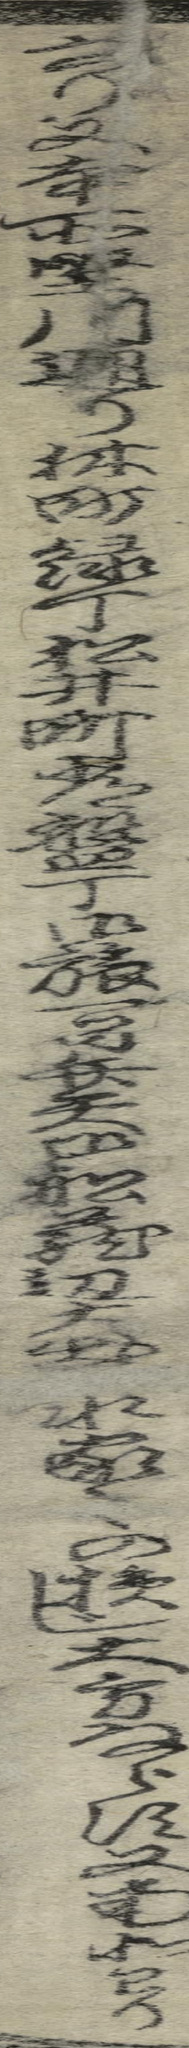なり又本所竪川通り林町緑丁松井町常磐丁御旅弁天御船蔵大出水家々の損じ大方ならず又南北わり
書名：江戸十里四方大風出水焼失　場所附
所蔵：東京大学地震研究所図書室 Earthquake Research Institute Library, The University of Tokyo, JAPAN
